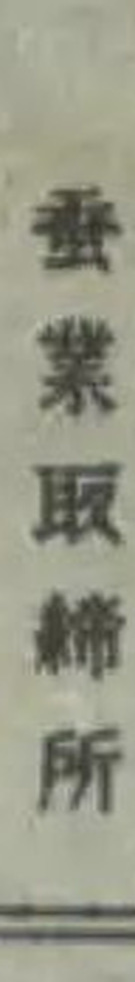蚕業取締所
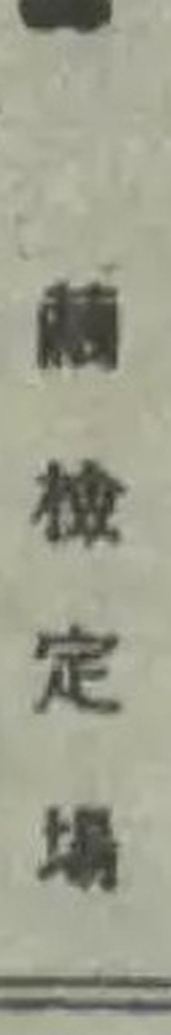繭検定場
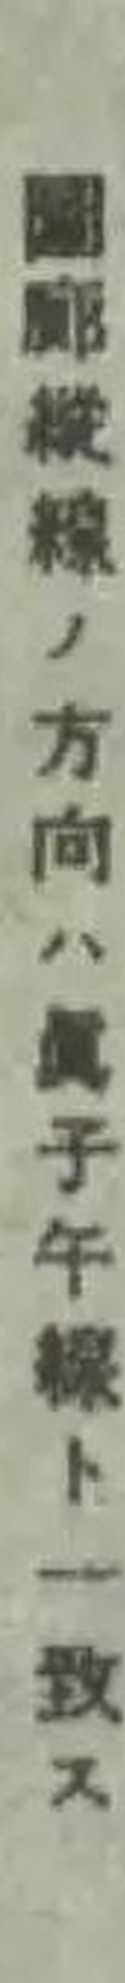囲廊縦線ノ方向ハ真子午線ト一致ス
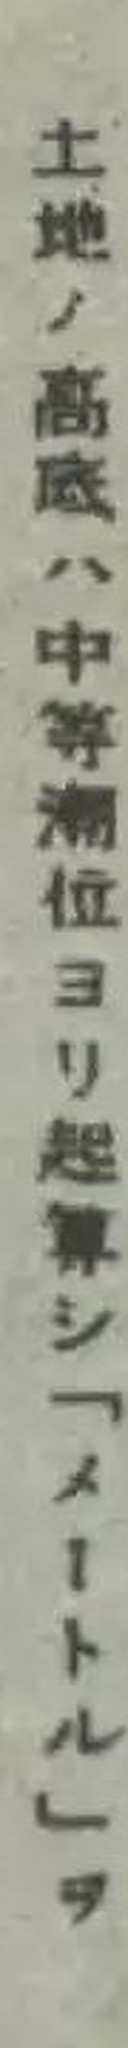土地ノ高低ハ中等潮位ヨリ起算シ「メートル」ヲ
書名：豊橋市都市計画第一期事業報告書
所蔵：国立国会図書館 National Diet Library, JAPAN
